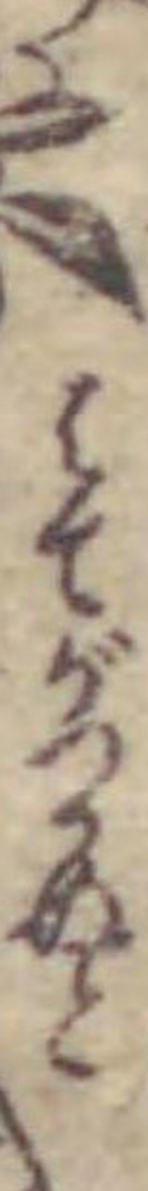はてがつかぬと
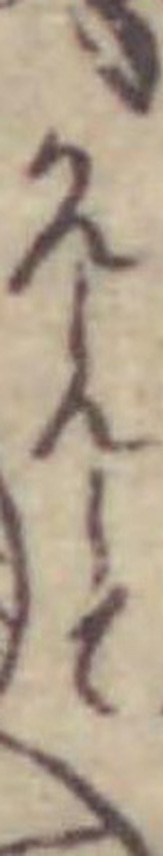かんしんしてな
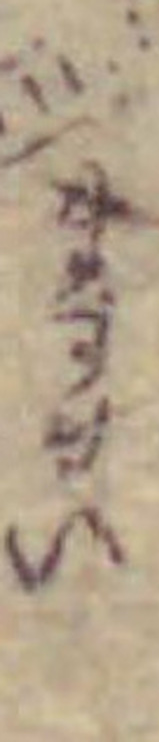ますわい
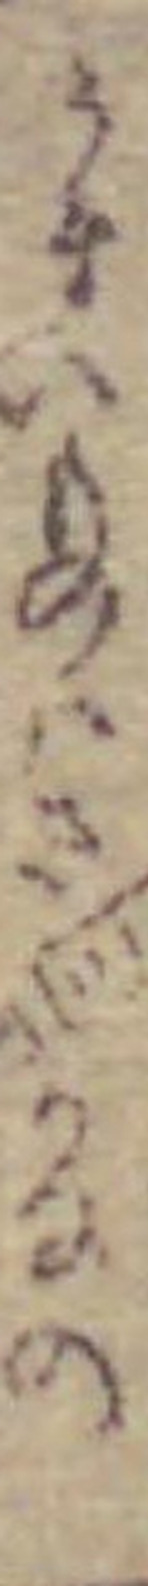うまいものはさかなの
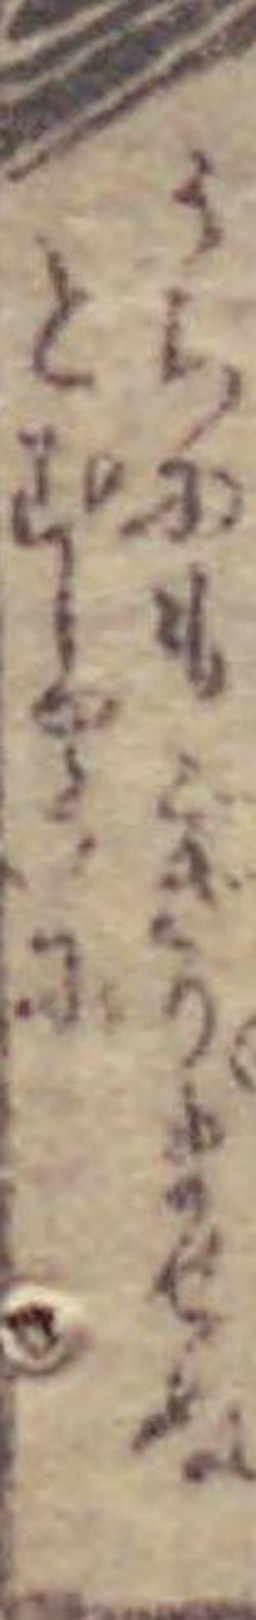とむしやうに
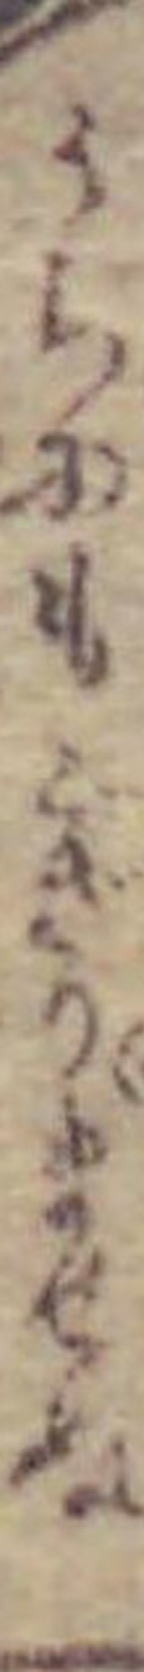うちにもござりませぬ
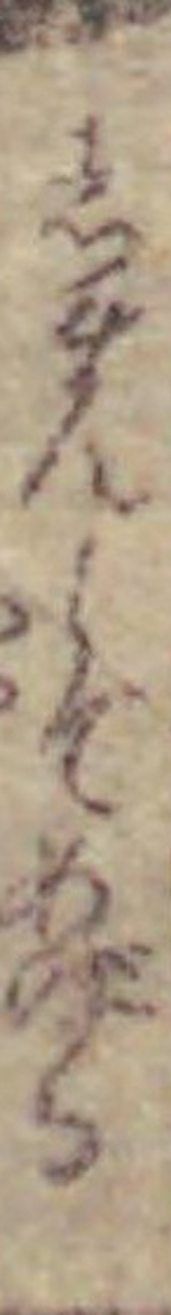しまんしてあげる
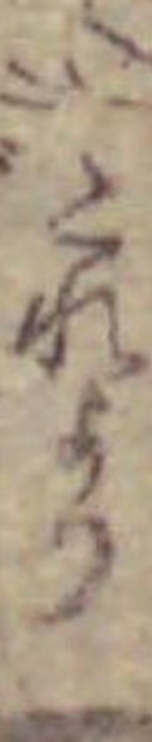これより
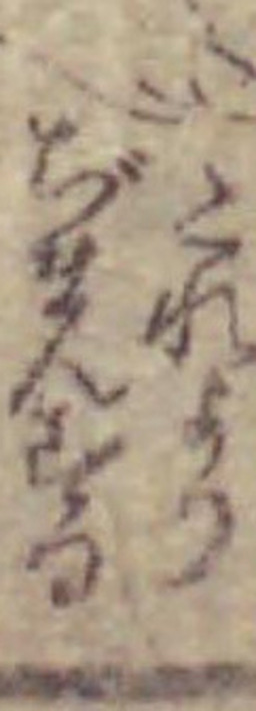ぢまんする
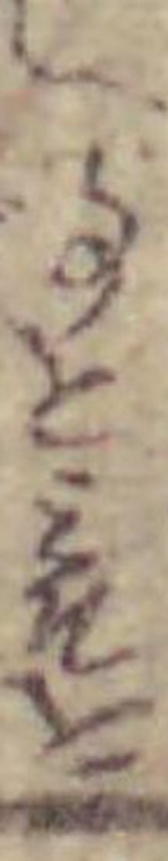事をみそを
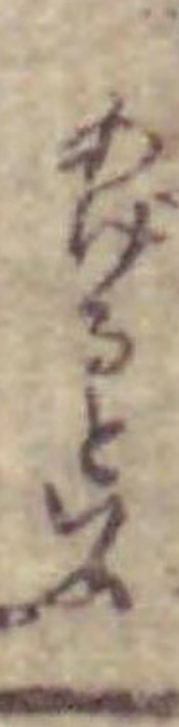あげるといふ
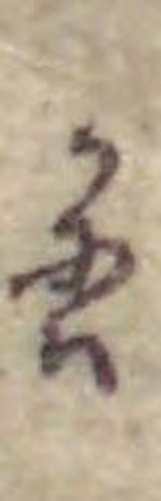かには
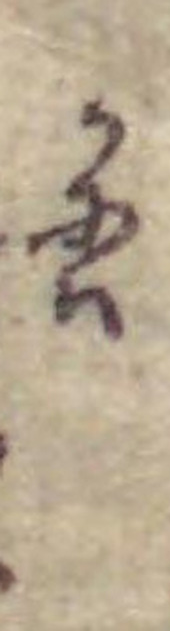かには
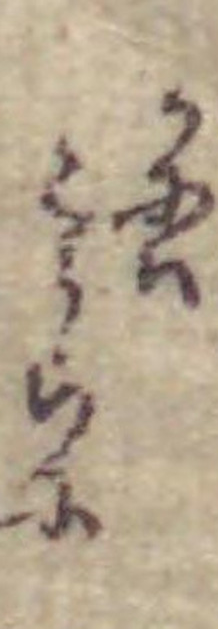こうらに
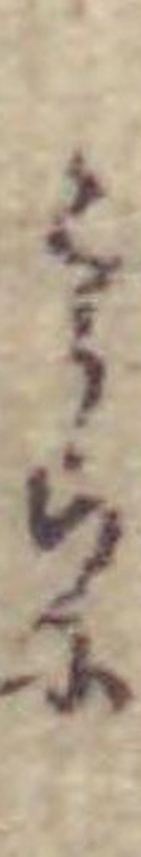こうらに
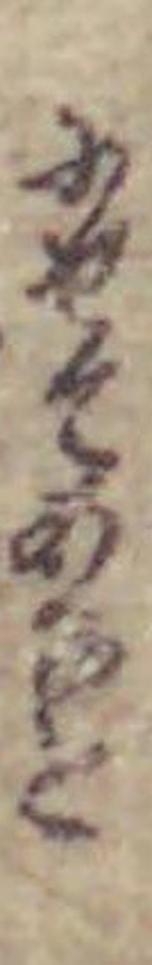にせてあると
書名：交古勢昔咄 : 2巻
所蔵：国立国会図書館 National Diet Library, JAPAN
